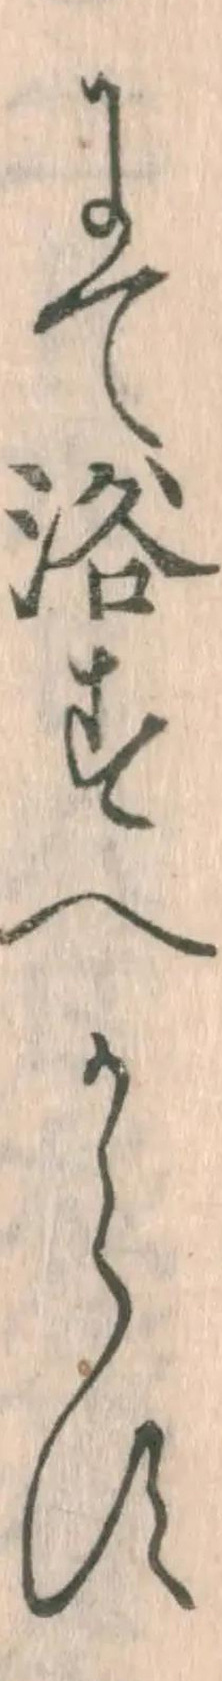にて浴すへからす
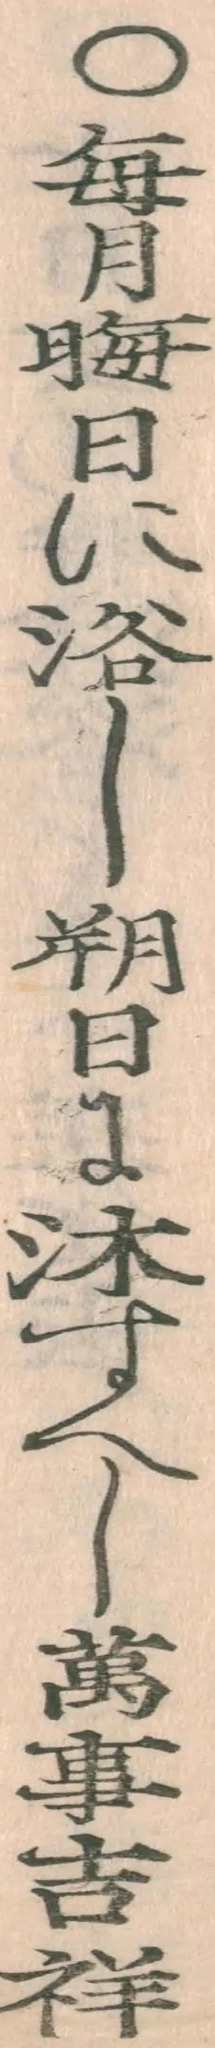〇毎月晦日に浴し朔日に沐すへし万事吉祥
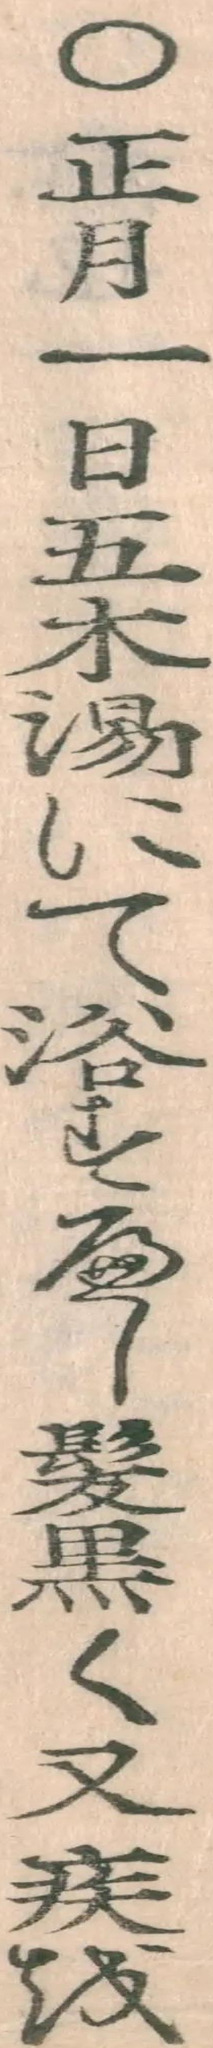〇正月一日五木湯にて浴すへし髪黒く又疾を
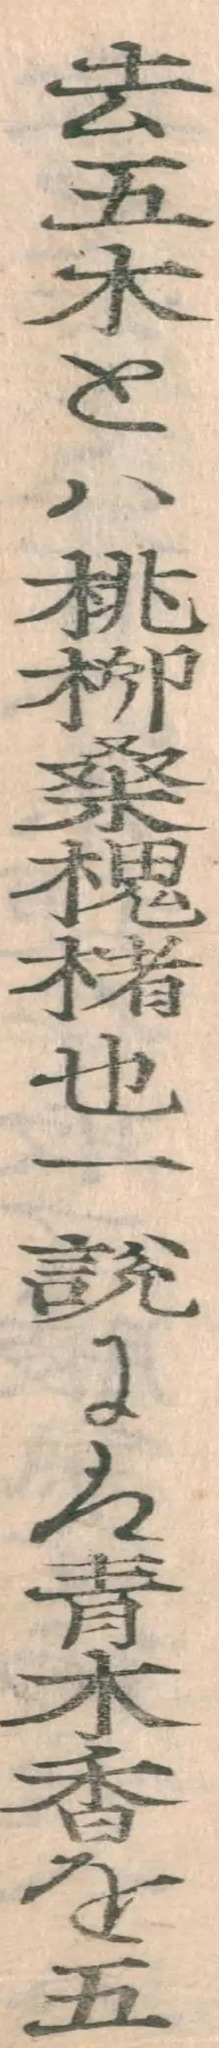去五木とは桃柳桑槐楮也一説には青木香を五

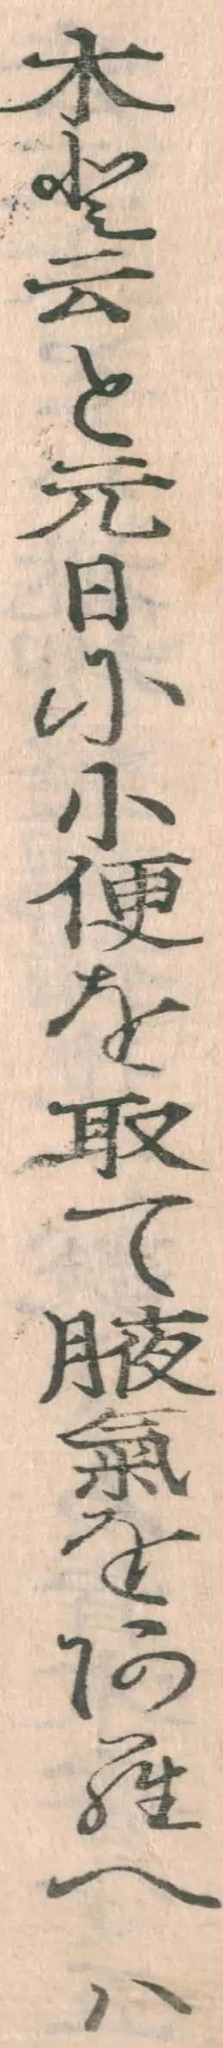木と云と元日に小便を取て腋気をあらへは
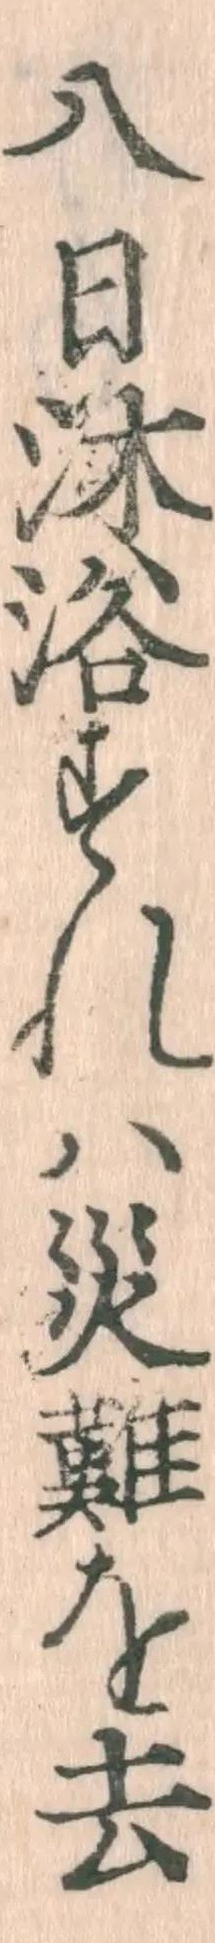八日沐浴すれは災難を去
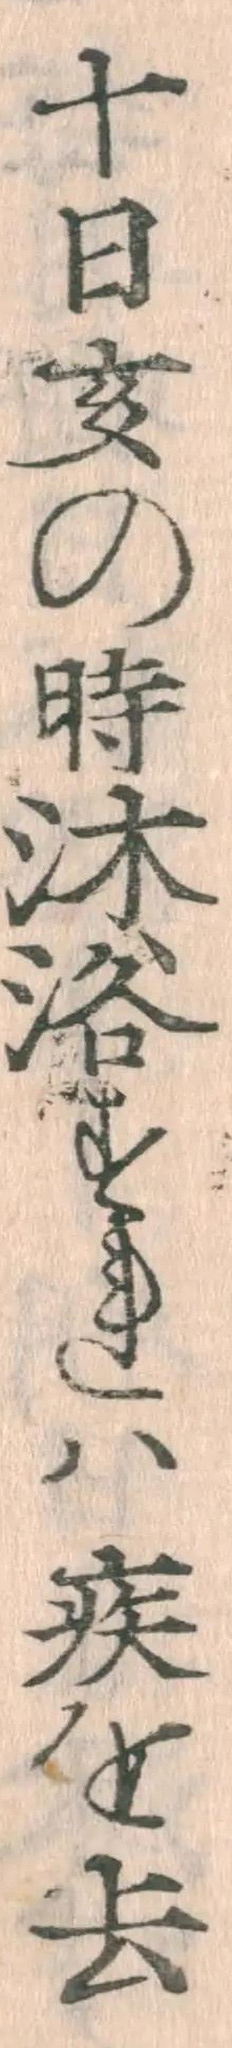十日亥の時沐浴すれは疾を去
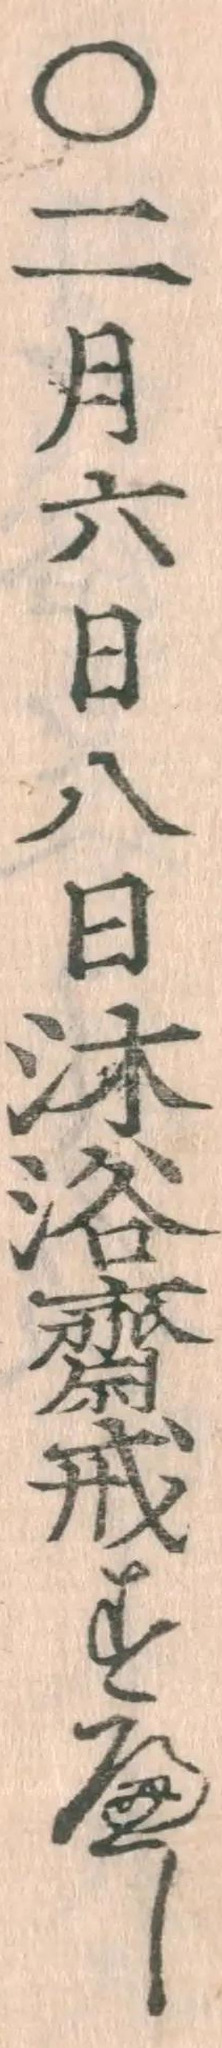〇二月六日八日沐浴斎戒すへし
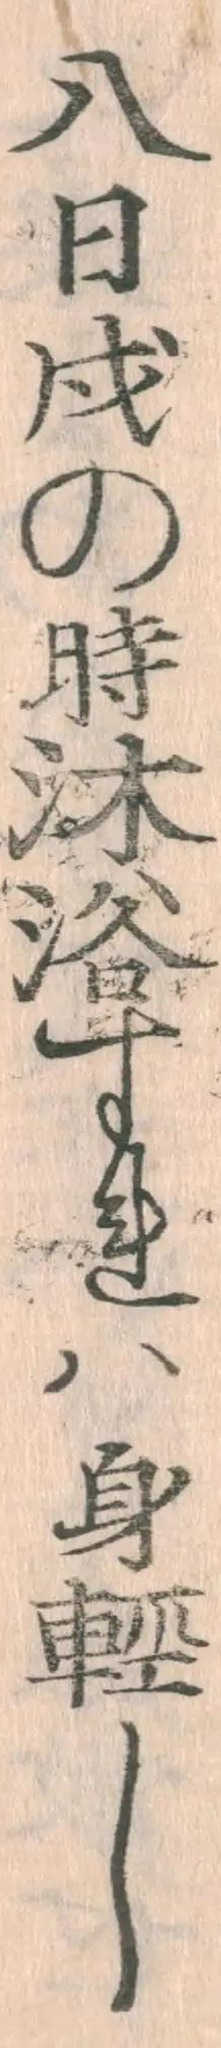八日戌の時沐浴すれは身軽し
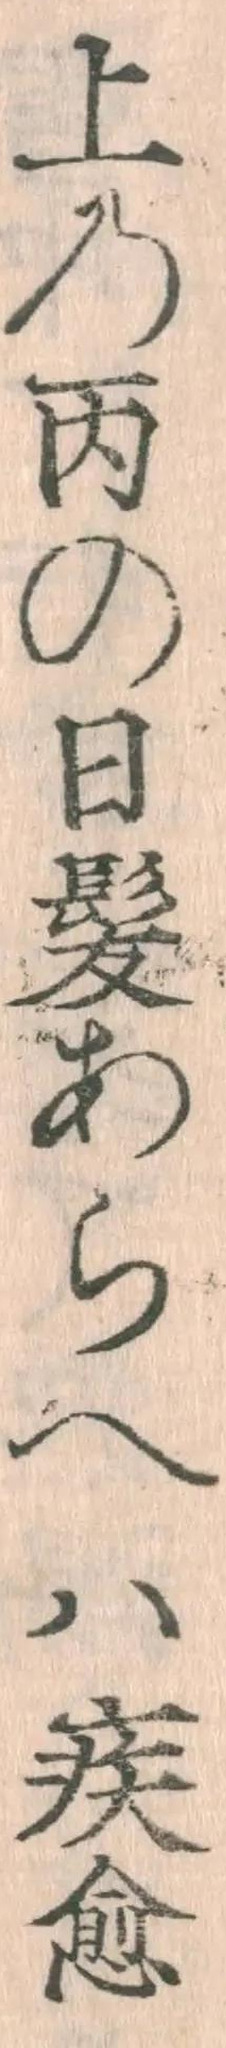上の丙の日髪あらへは疾愈
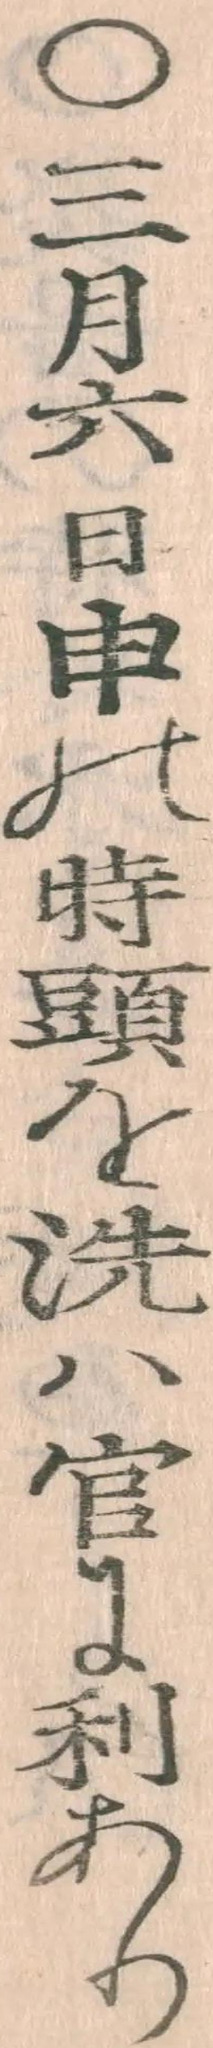〇三月六日申の時頭を洗は官に利あり
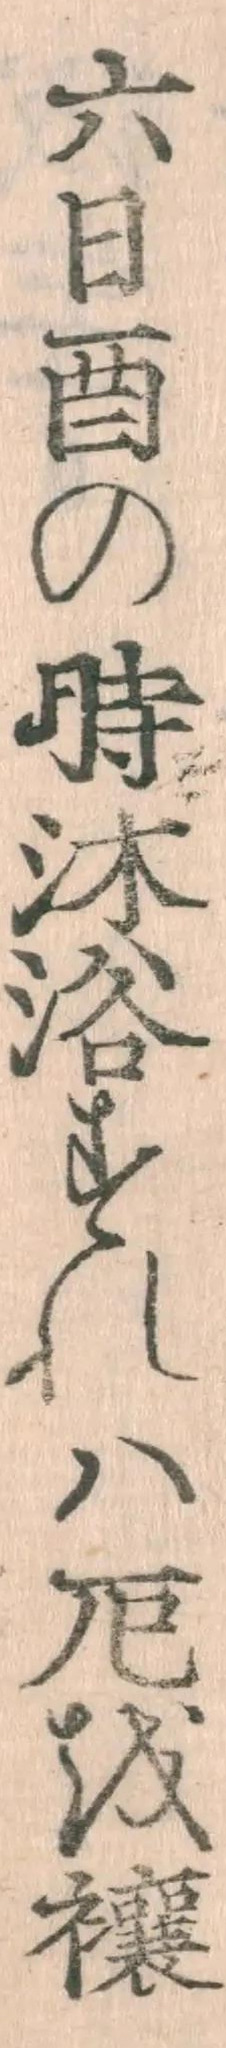六日酉の時沐浴すれは厄を禳
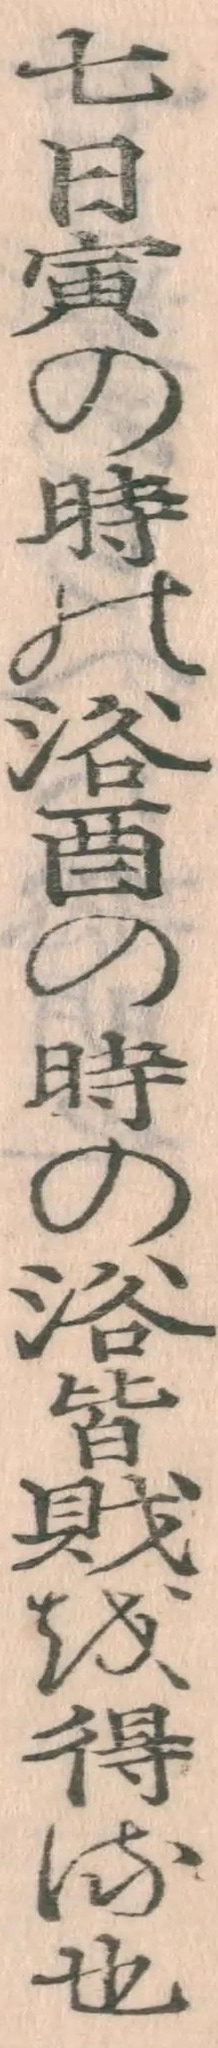七日寅の時の浴酉の時の浴皆財を得る也
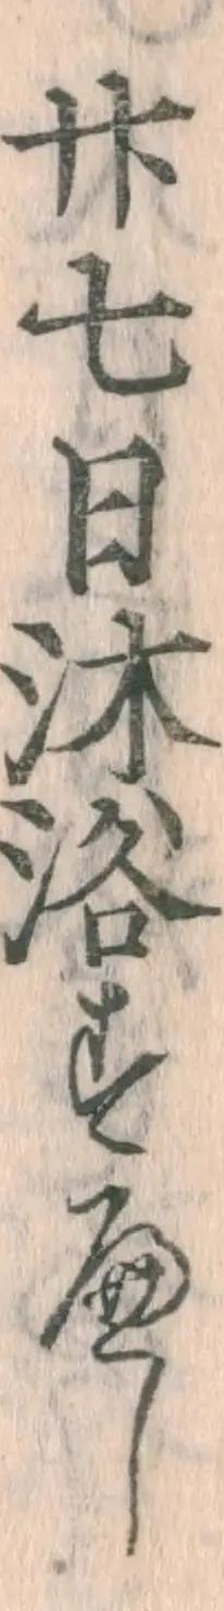廿七日沐浴すへし
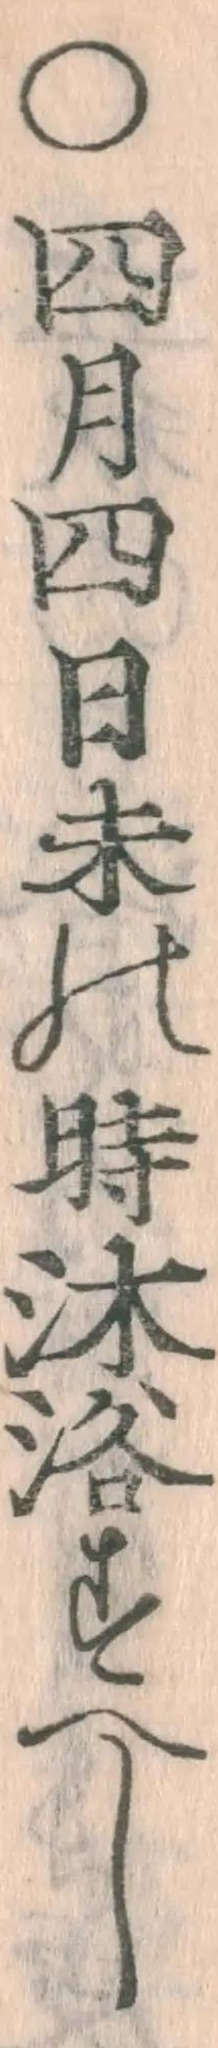〇四月四日未の時沐浴すへし
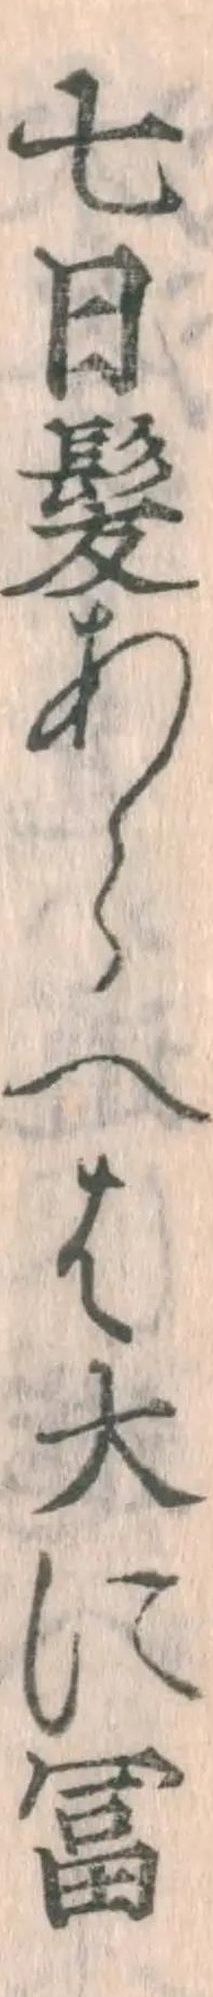七日髪あらへは大に富
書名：延壽撮要
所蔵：国立国会図書館 National Diet Library, JAPAN
